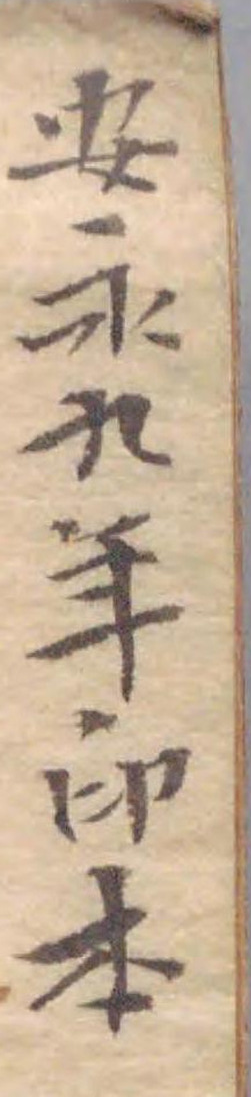安永九年印本

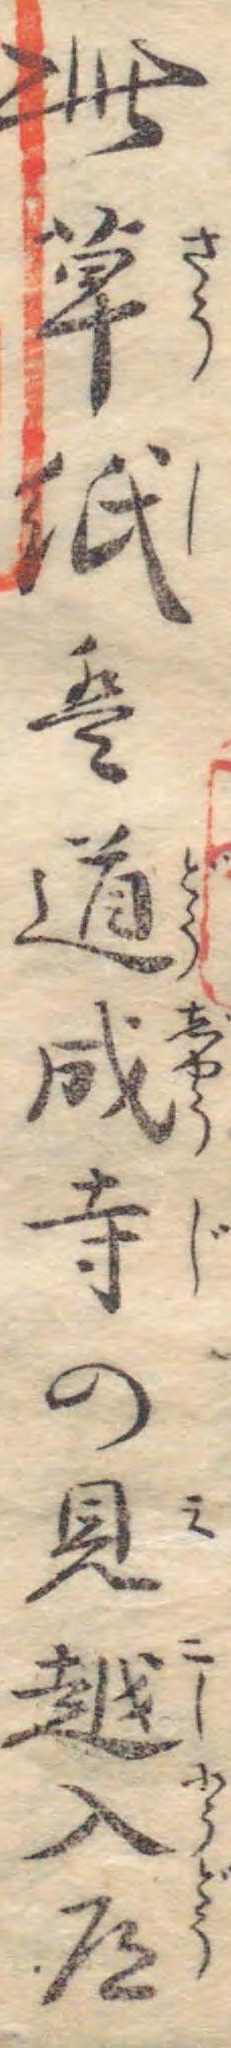此草紙は道成寺の見越入道
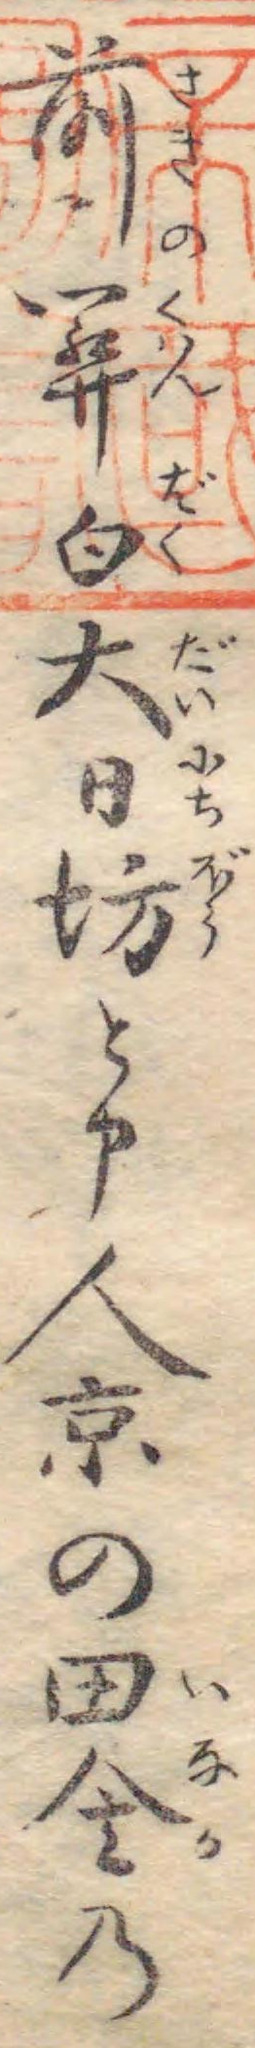前関白大日坊と申人京の田舎の
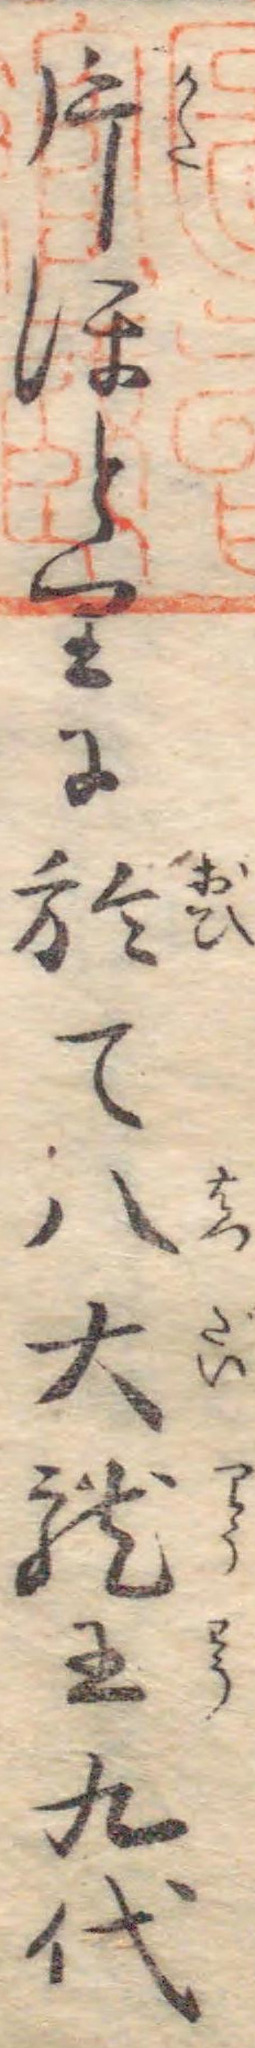片ほとりに於て八大龍王九代
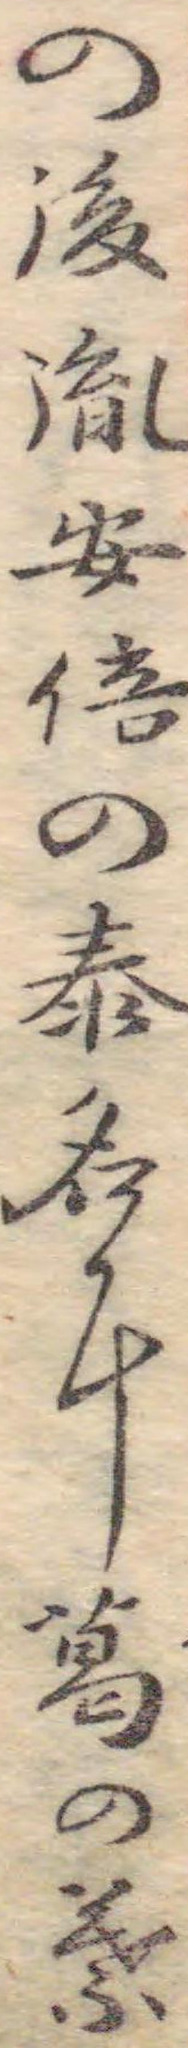の後胤安倍の泰名に葛の葉
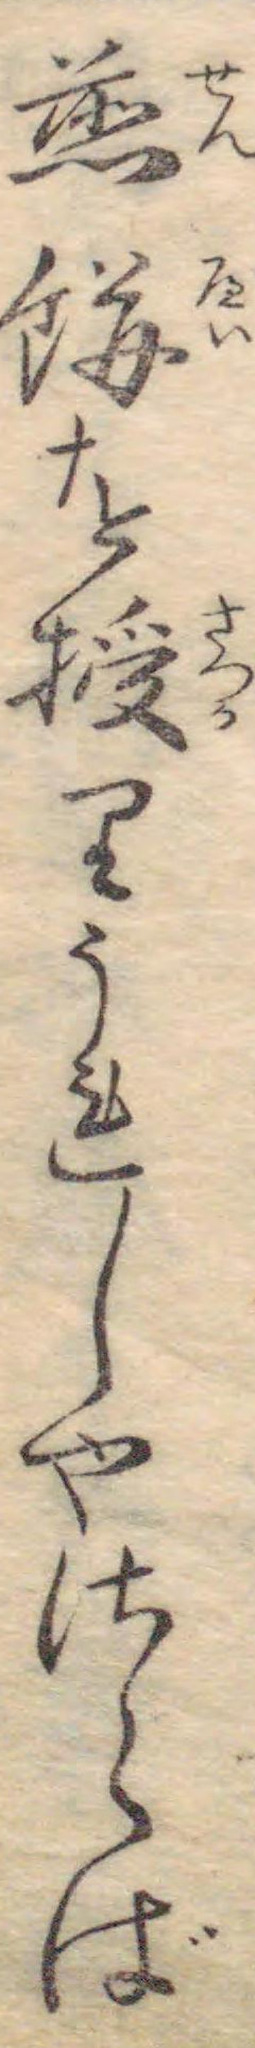煎餅を授りうれしやさらば

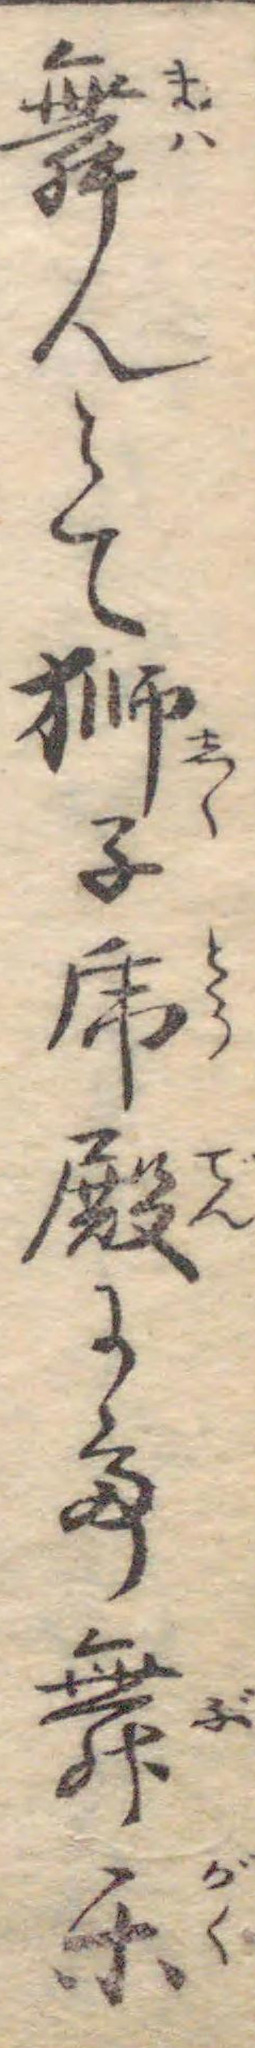舞んとて獅子虎殿にて舞楽
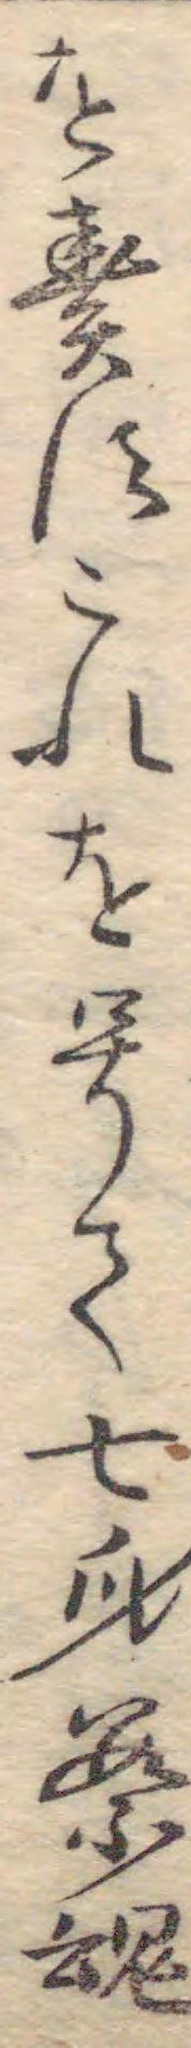を奏すこれを号て七身繁魂
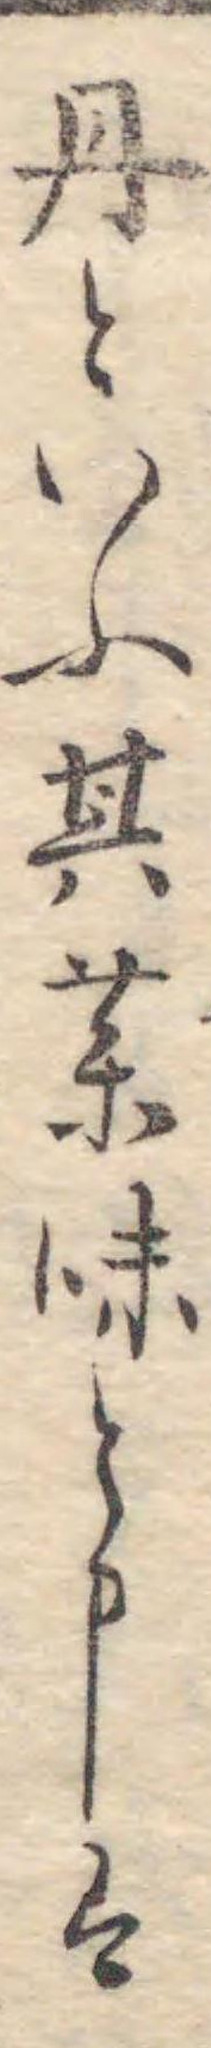丹といふ其薬味と申は
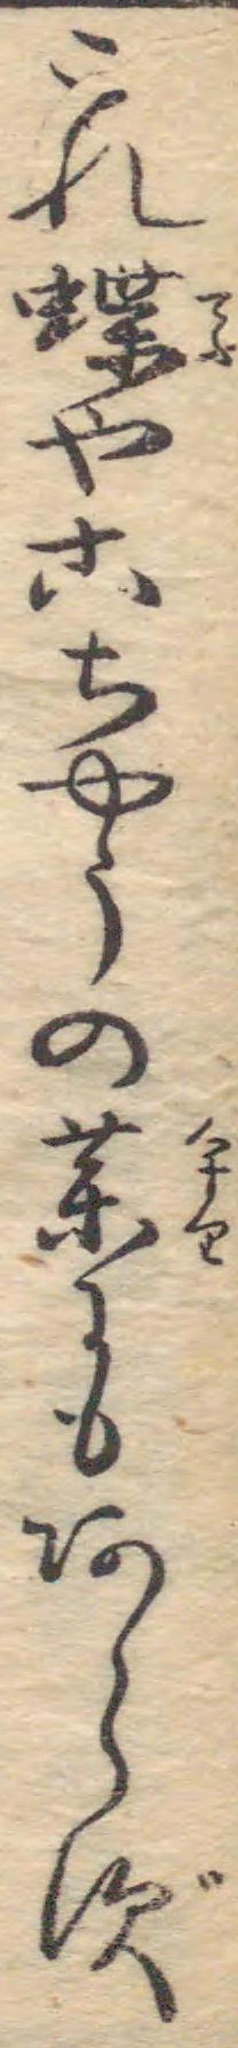これ蝶やこちやうの薬にもあらず
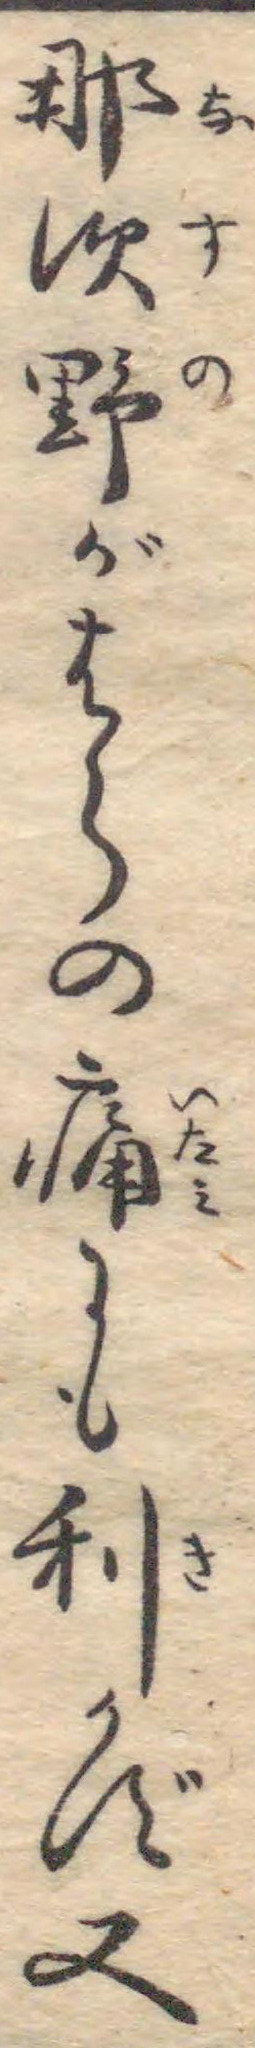那須野がはらの痛にも利かず又
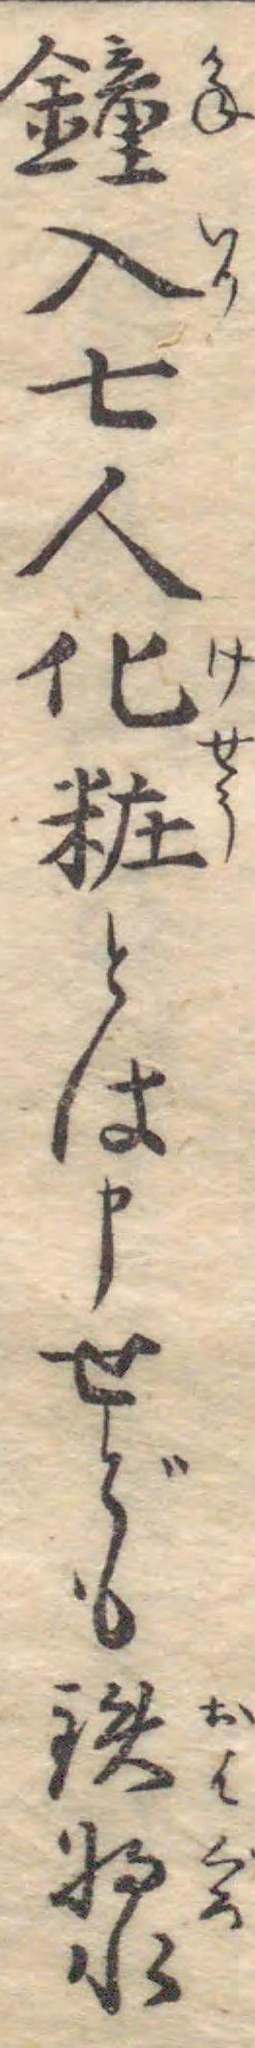鐘入七人化粧とは申せども鉄漿
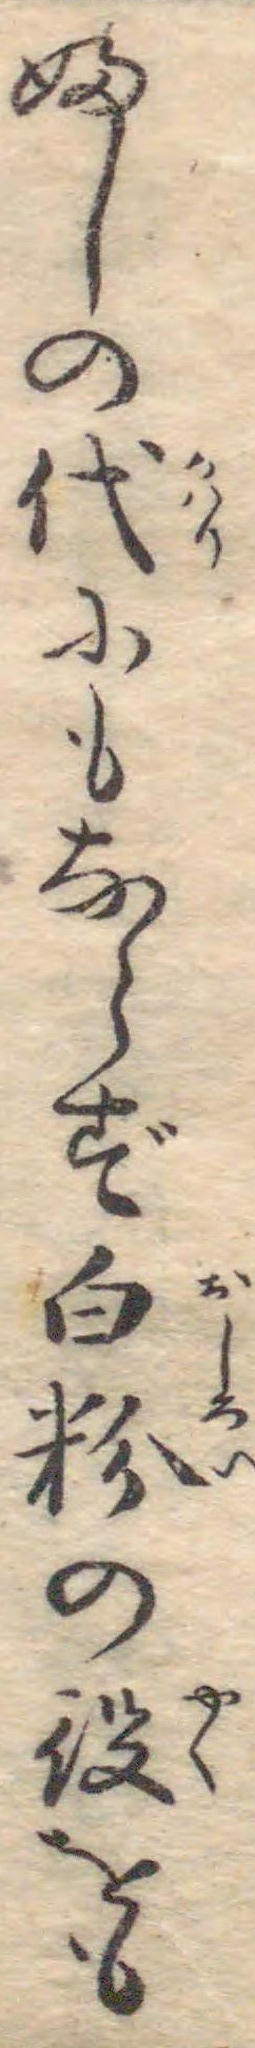ふしの代にもならず白粉の役をも
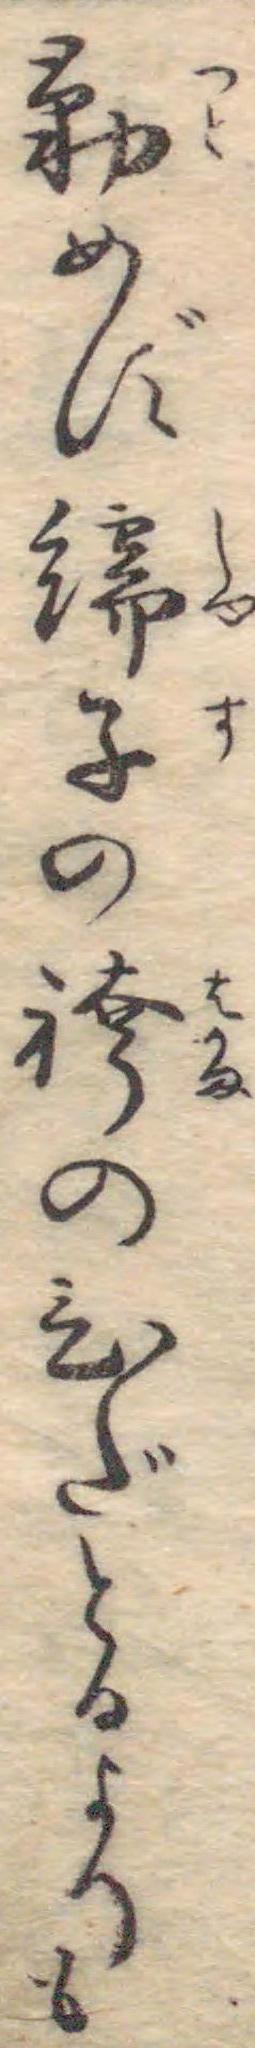勤めず繻子の袴のひだとるよりも
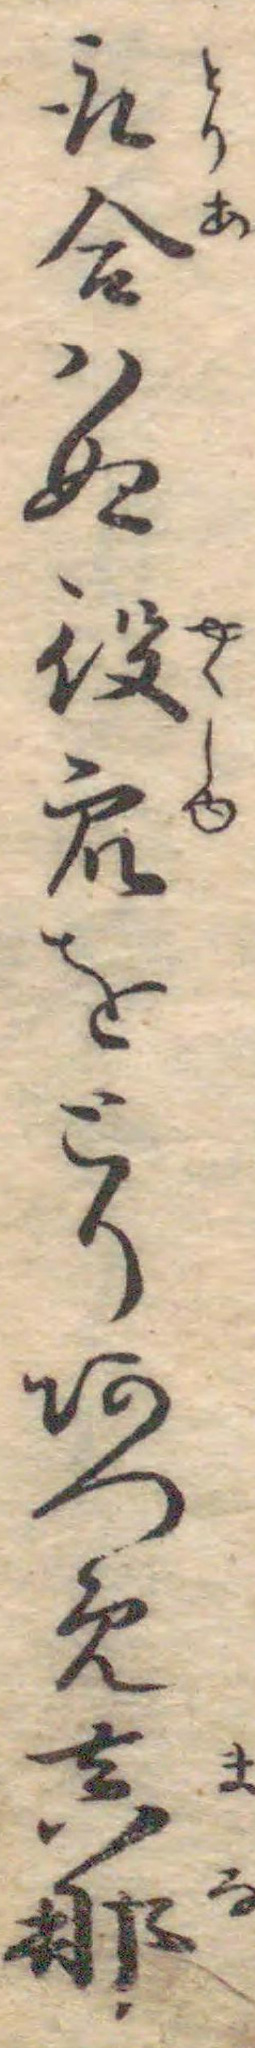取合はぬ役衆をとりあつめ真那

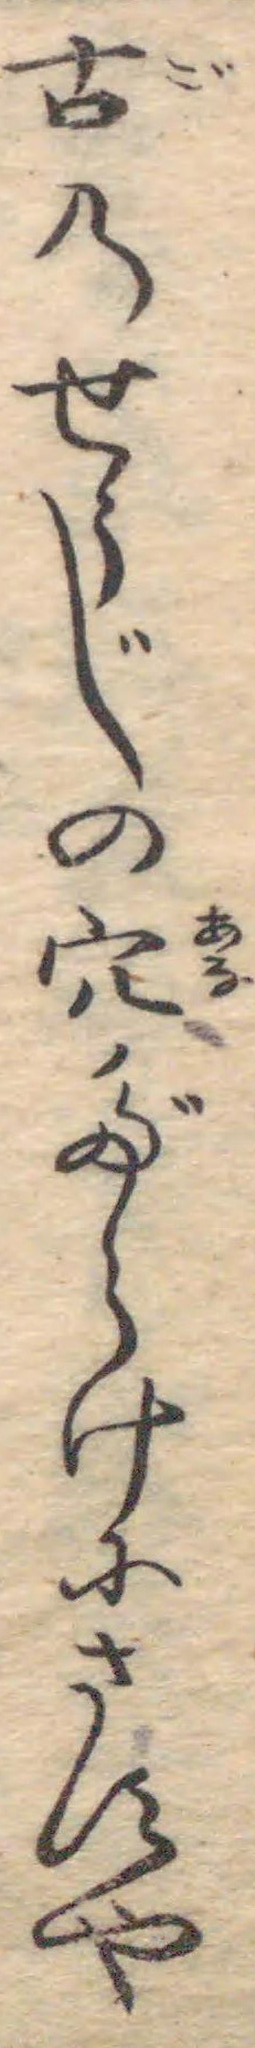古のせうじの穴だらけにさすや
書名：鐘入七人化粧 : 3巻
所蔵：国立国会図書館 National Diet Library, JAPAN
